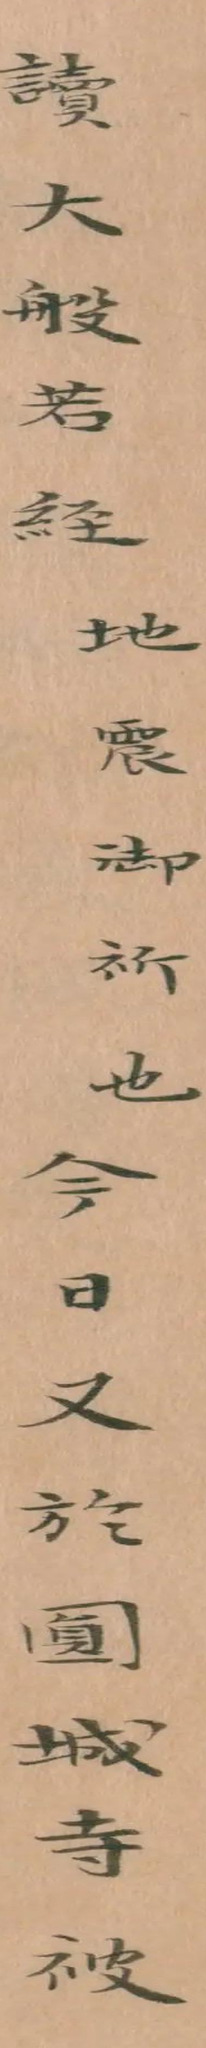読大般若経地震御祈也今日又於円城寺被
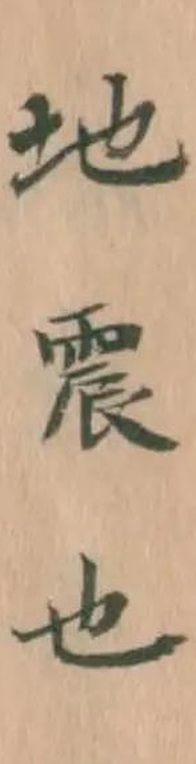地震也
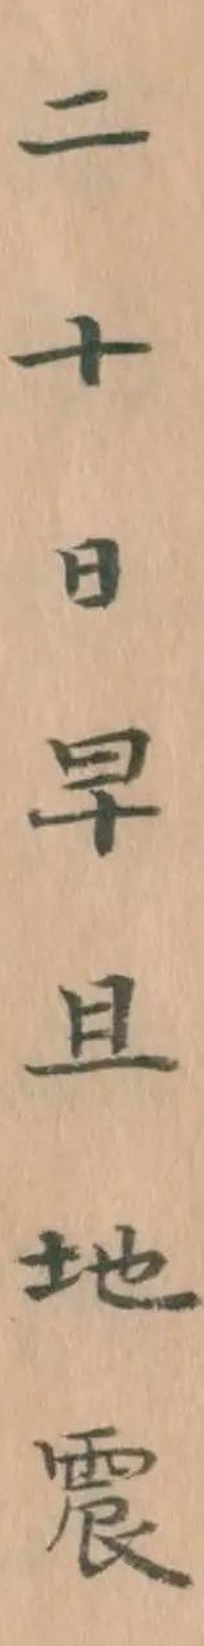二十日早旦地震

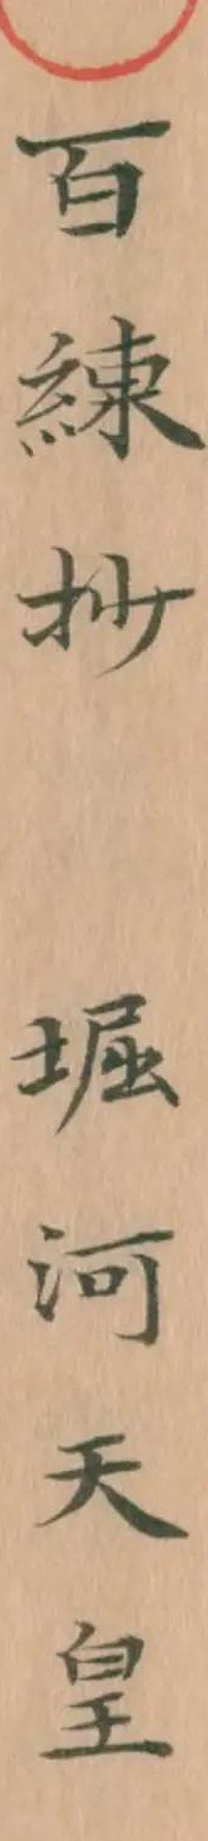○百練抄堀河天皇
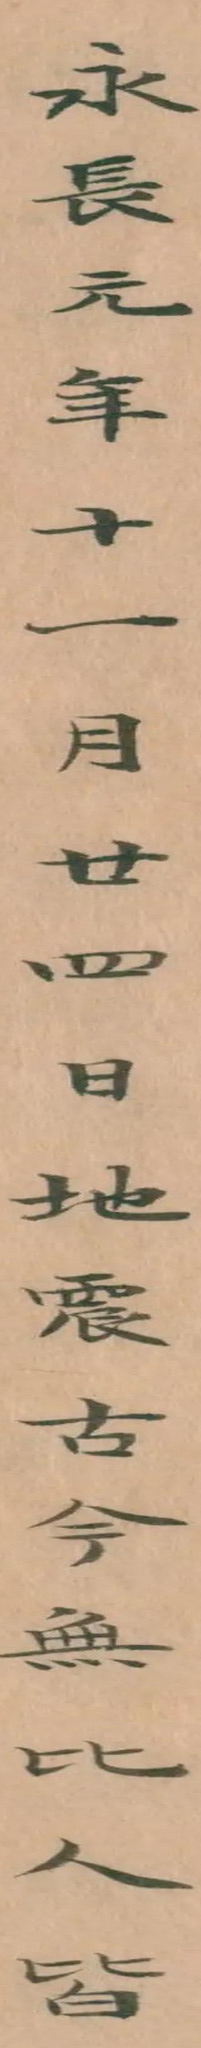永長元年十一月廿四日地震古今無比人皆
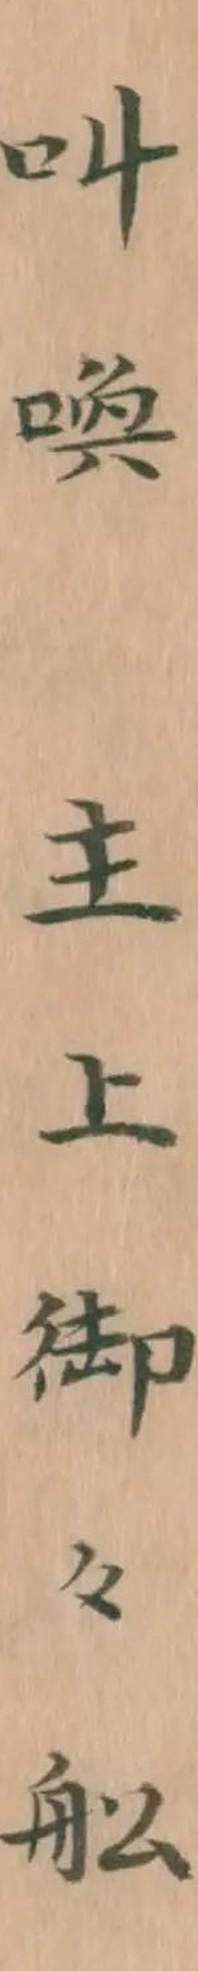叫喚主上御々船
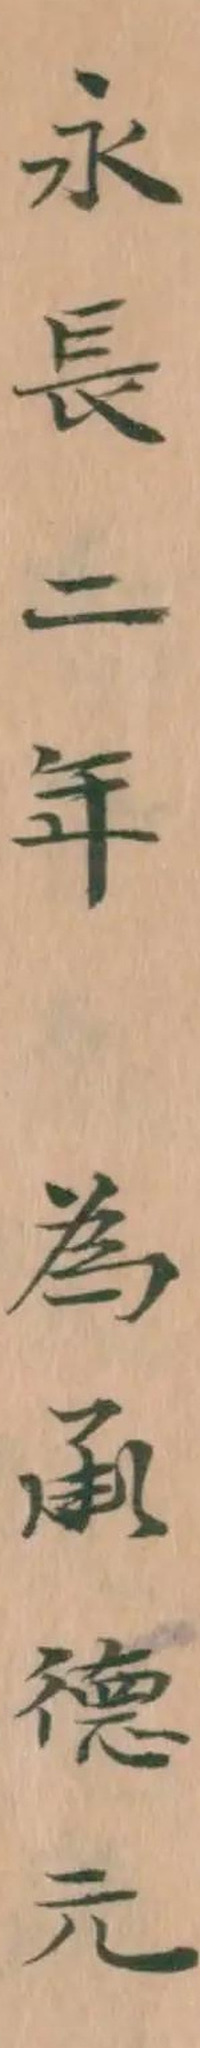永長二年為承徳元
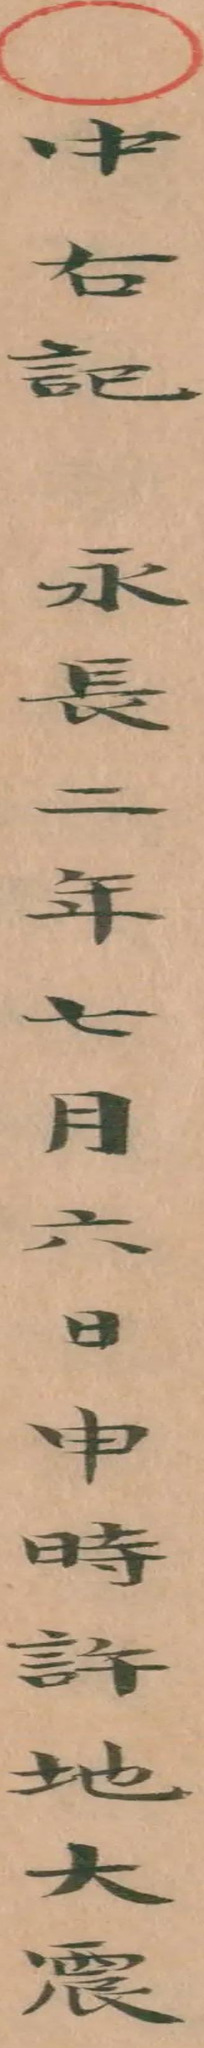○中右記永長二年七月六日申時許地大震
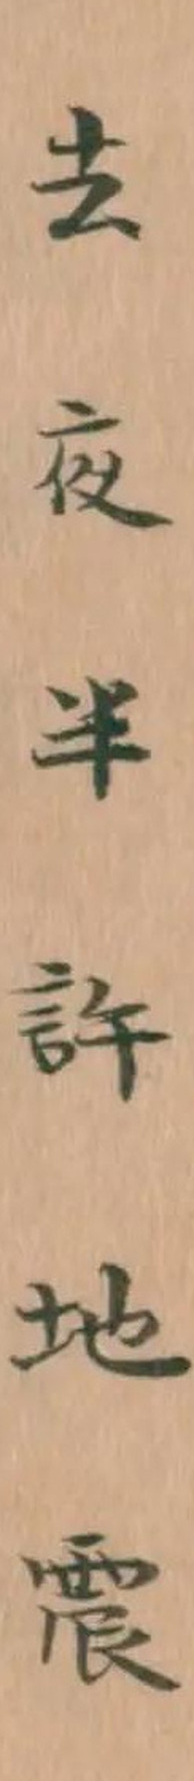去夜半許地震
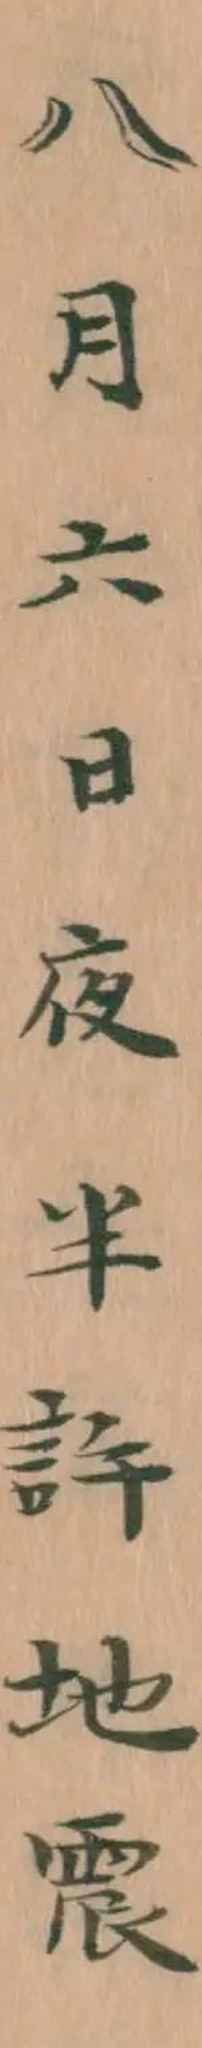八月六日夜半許地震
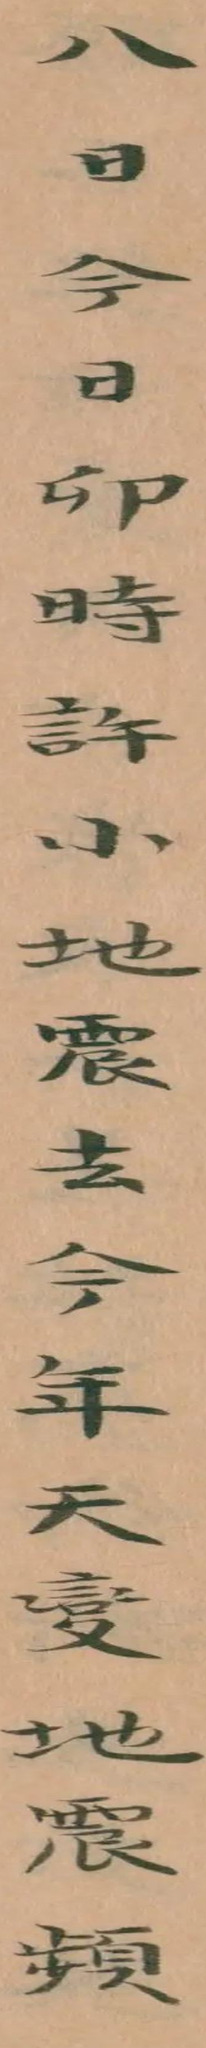八日今日卯時許小地震去今年天変地震頻
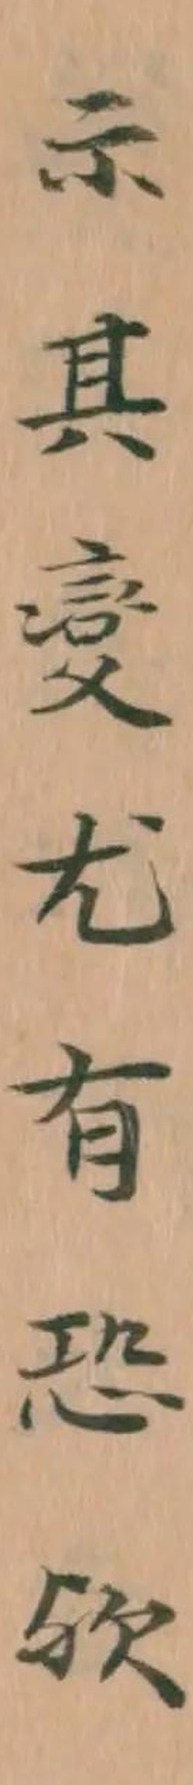示其変尤有恐歟
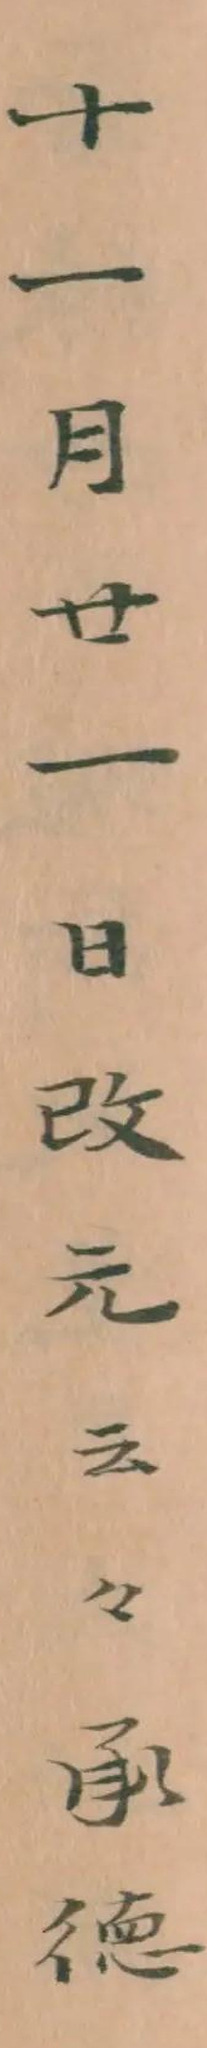十一月廿一日改元云々承徳
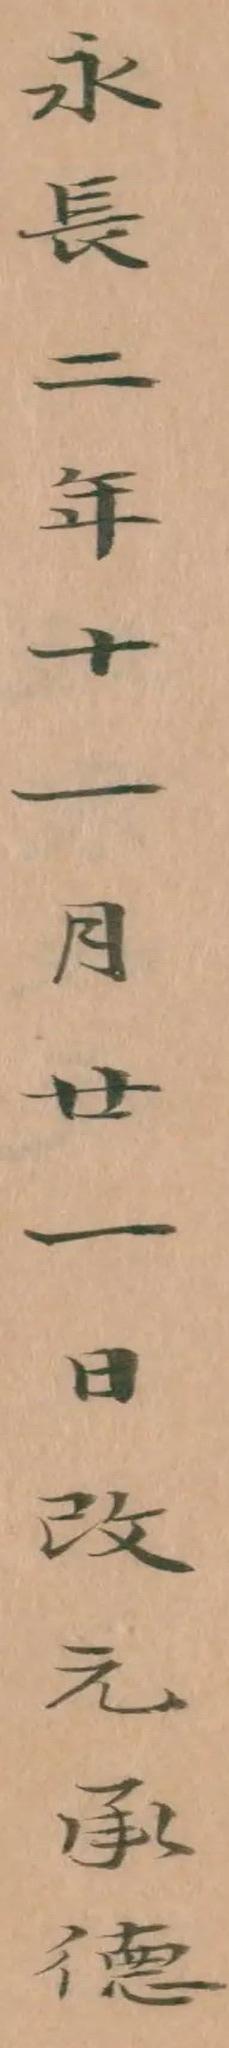永長二年十一月廿一日改元承徳
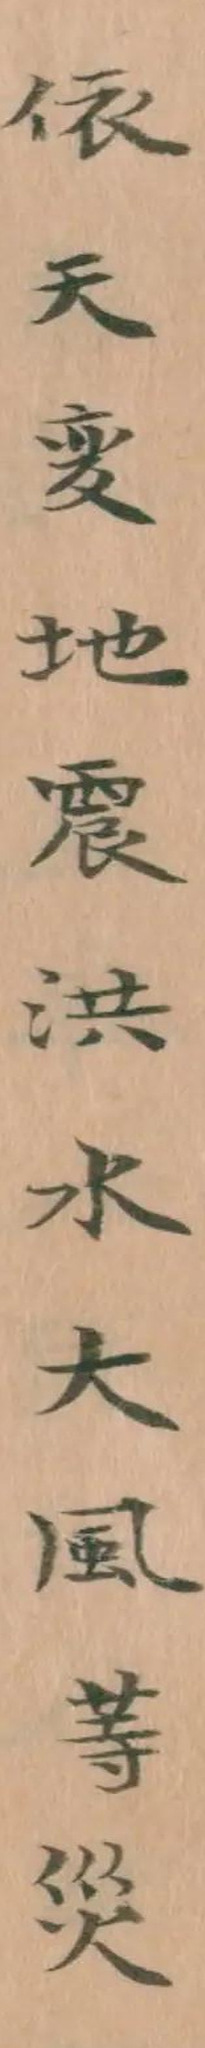依天変地震洪水大風等災
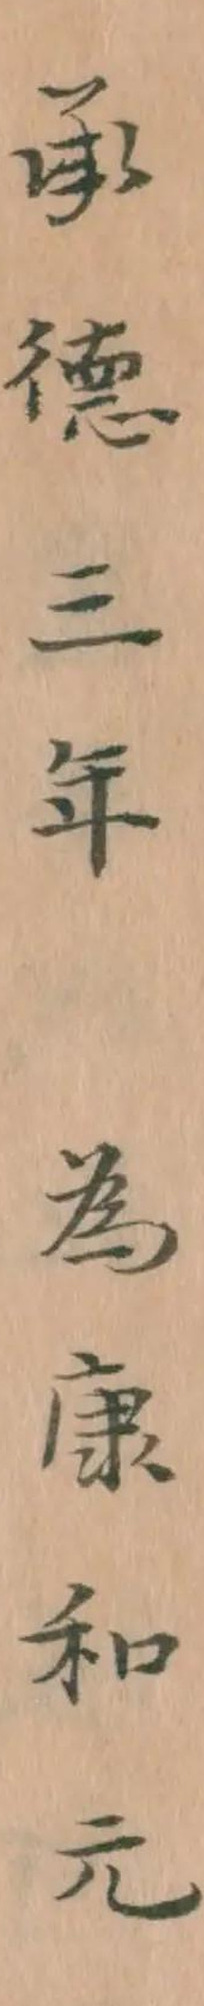承徳三年為康和元
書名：地災撮要. 巻5-6(地震之部)
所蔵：国立国会図書館 National Diet Library, JAPAN
